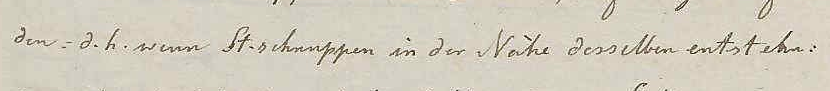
den: d. h. wenn St.schnuppen in der Nähe desselben entstehn:
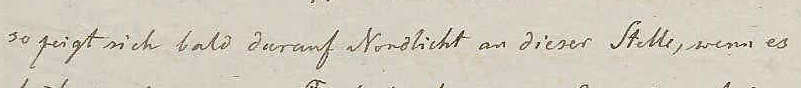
so zeigt sich bald darauf Nordlicht an diese Stelle, wenn es
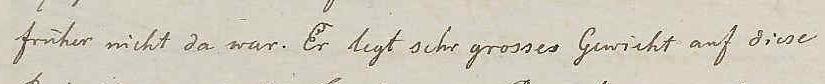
früher nicht da war. Er legt sehr grosses Gewicht auf diese
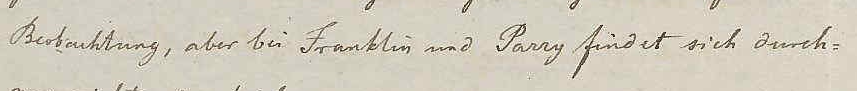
Beobachtung, aber bei Franklin und Parry findet sich durch-
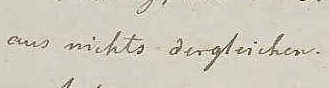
aus nichts dergleichen.
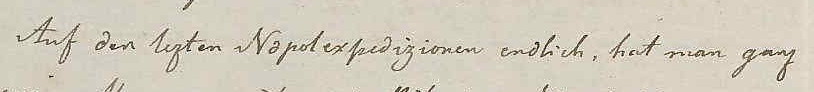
Auf den lezten Ndpolexpedizionen endlich, hat man ganz
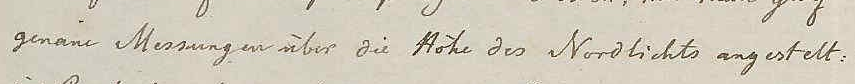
genaue Messungen über die Höhe des Nordlichts angestellt:
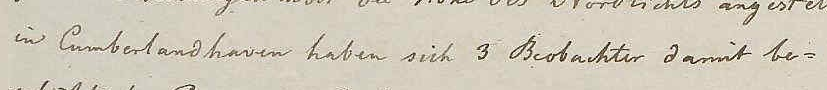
in Cumberlandhaven haben sich 3 Beobachter damit be-
